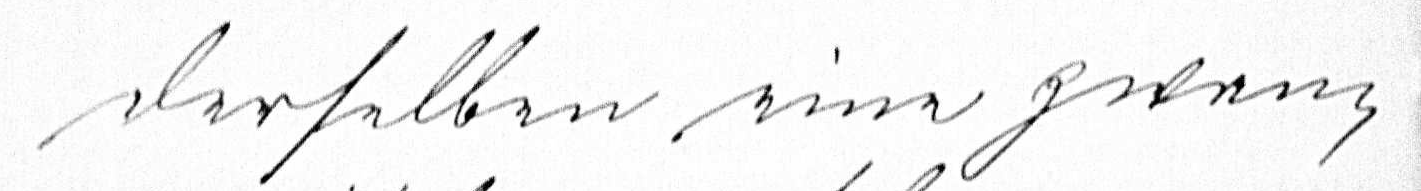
derselben eine zwan¬
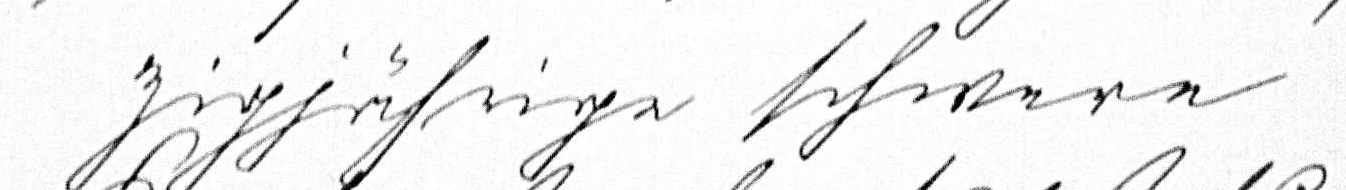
zigjährigen schweren
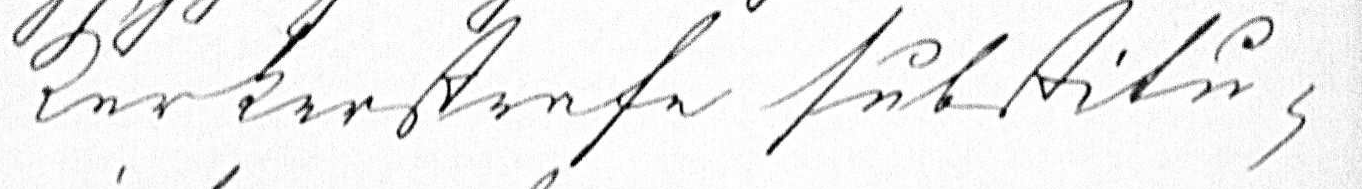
Kerkerstrafe substitu¬
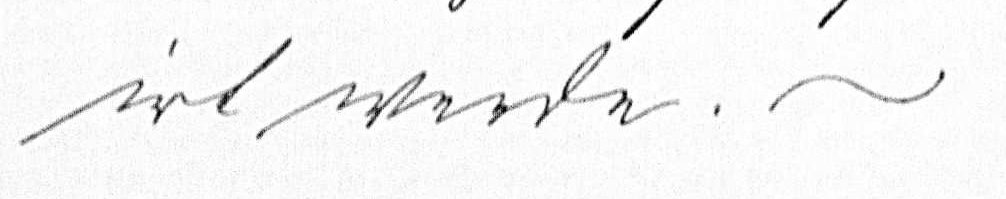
irt werde.
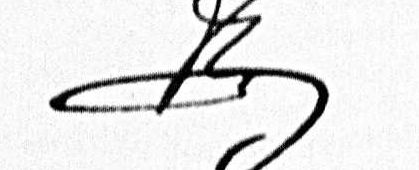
FJ
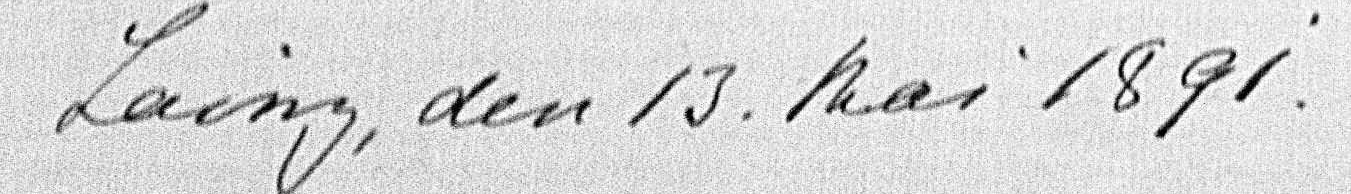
Lainz, den 13. Mai 1891
